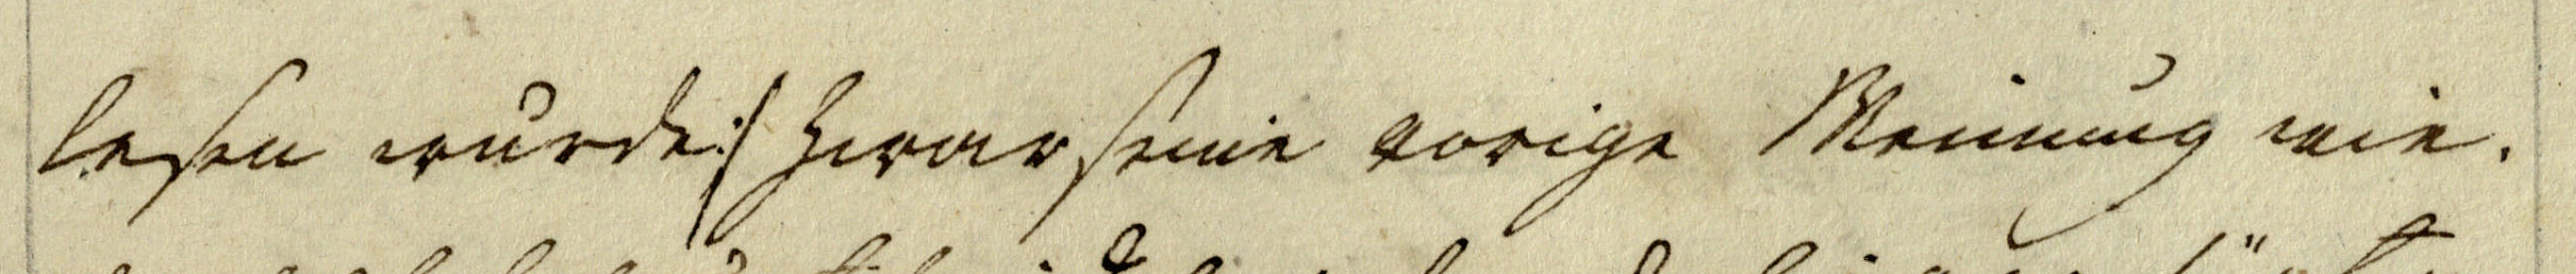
lesen wurde :/ zwar seine vorigen Meinung wie¬
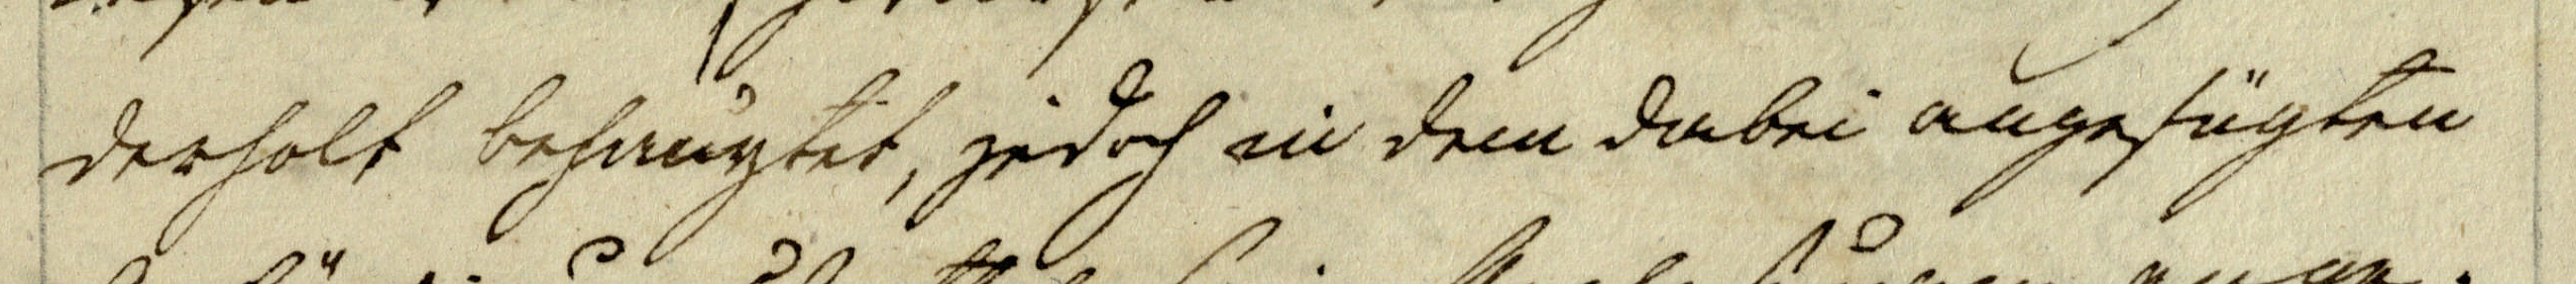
derholt behauptet, jedoch in dem dabei angefügten
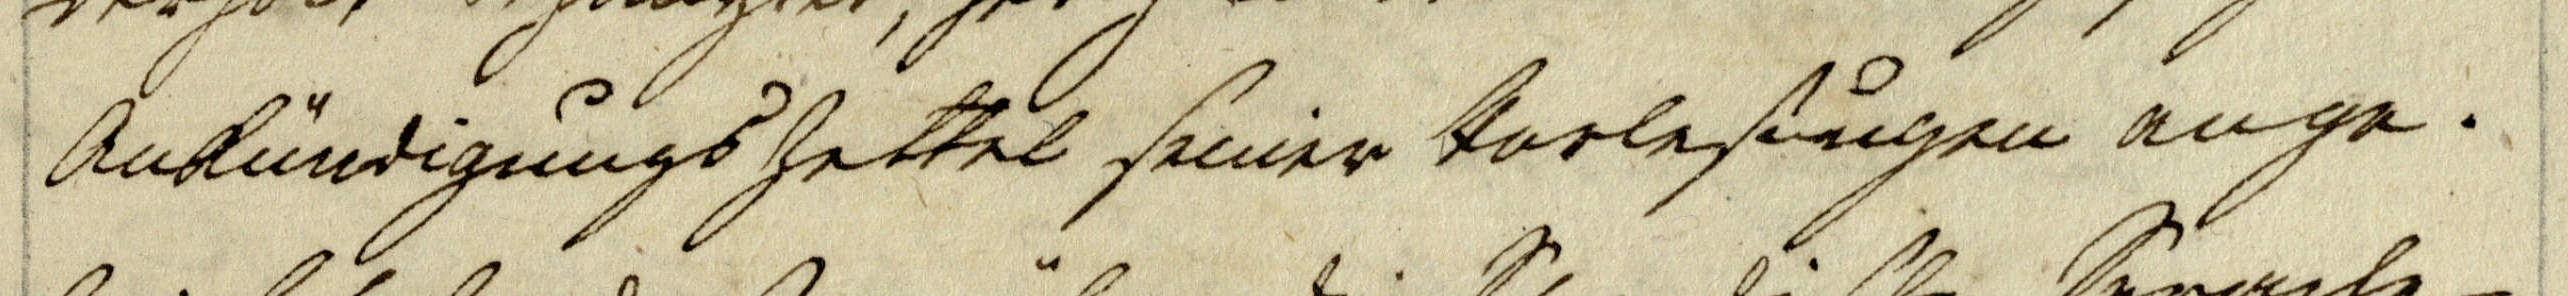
Ankündigungszettel seiner Vorlesungen ange¬
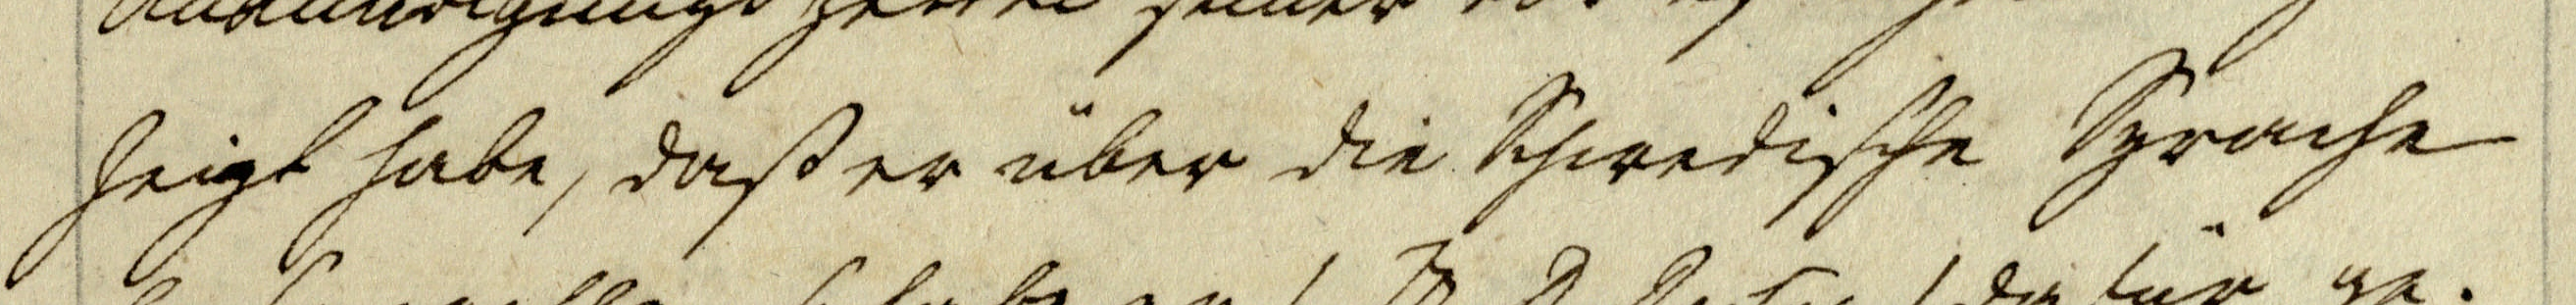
zeiget habe, daß er über die Schwedische Sprache
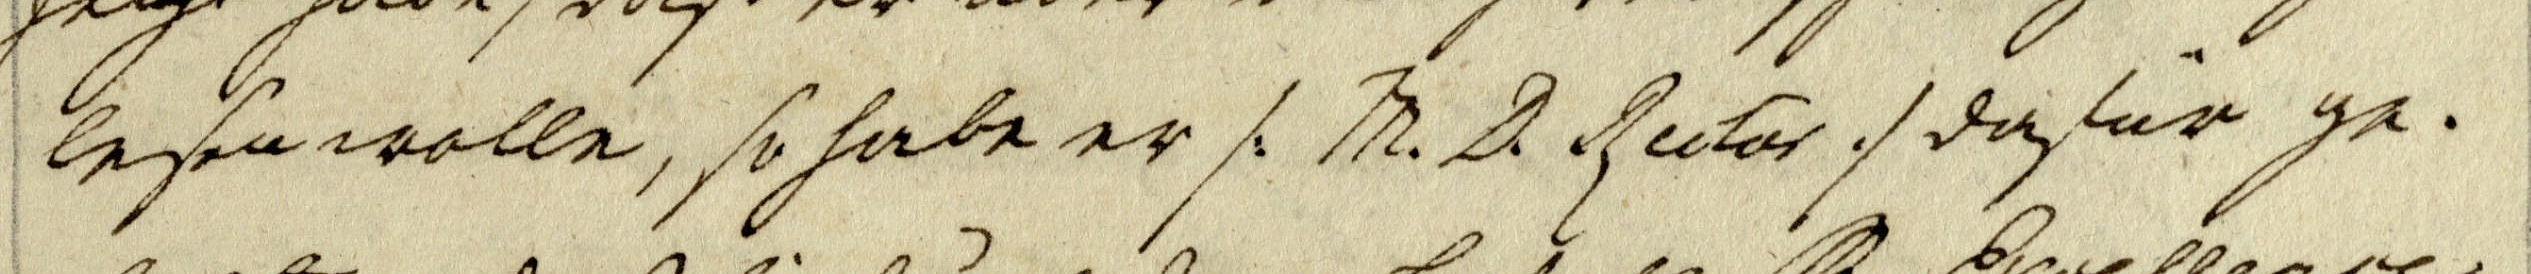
lesen wolle, so habe er /. M. D. Rector ./ dafür ge¬
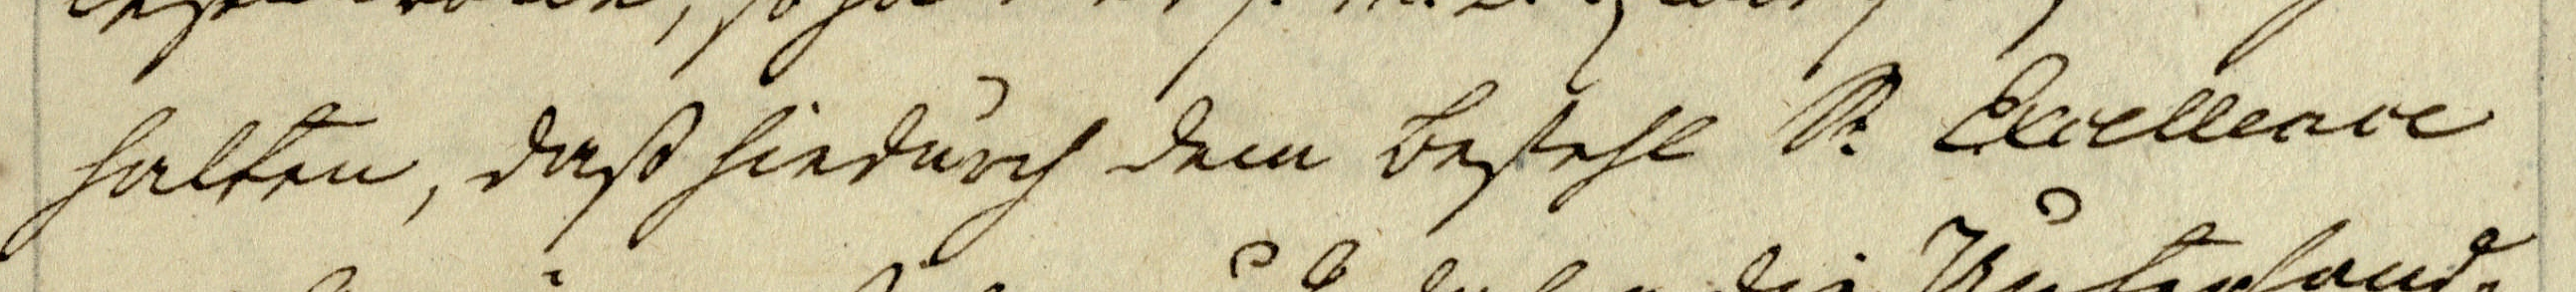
halten, daß hiedurch dem Befehl Sr Excellence
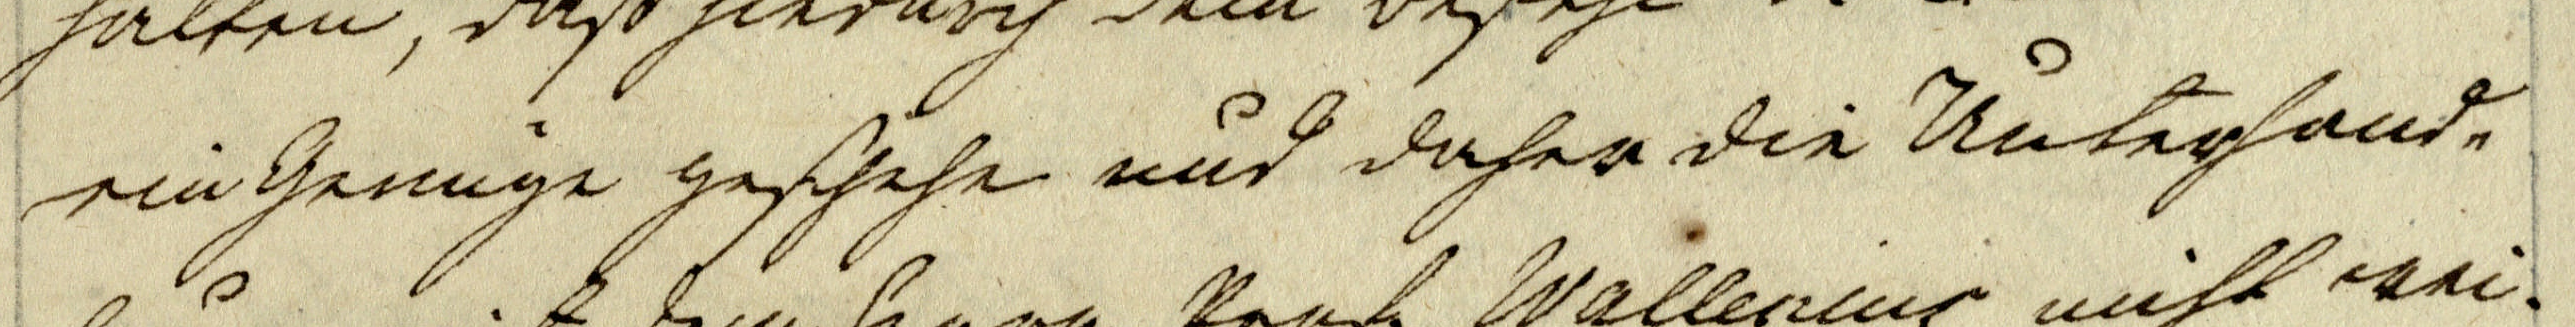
ein Genüge geschehe und daher die Unterhand¬
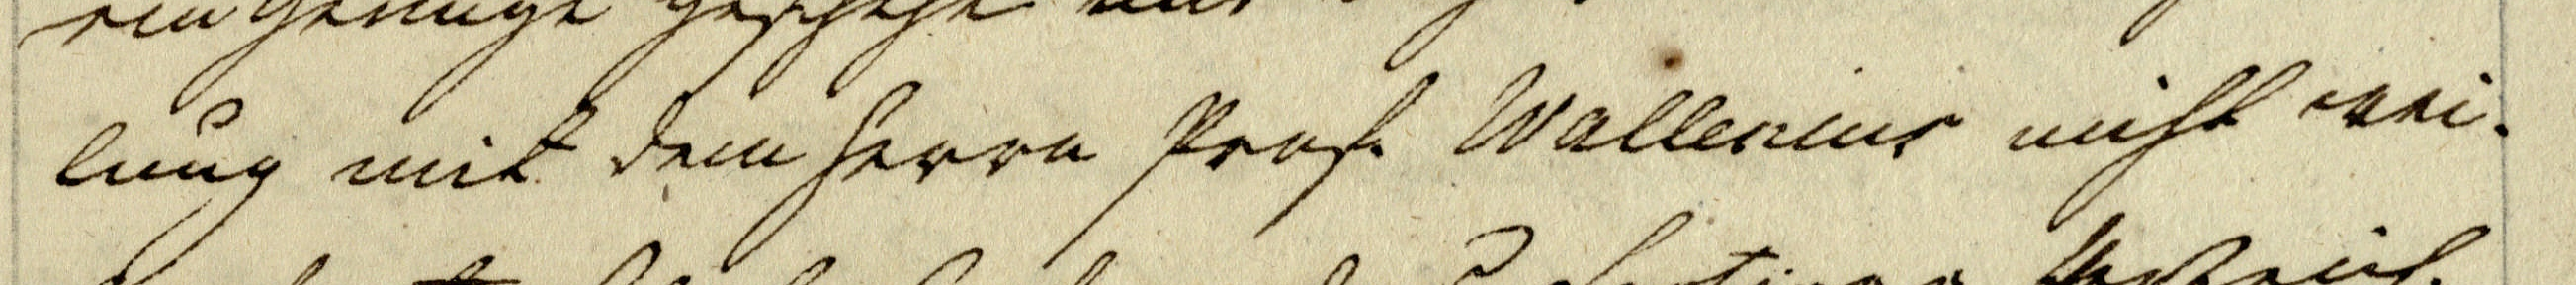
lung mit dem Herrn Prof. Wallenius nicht wei¬
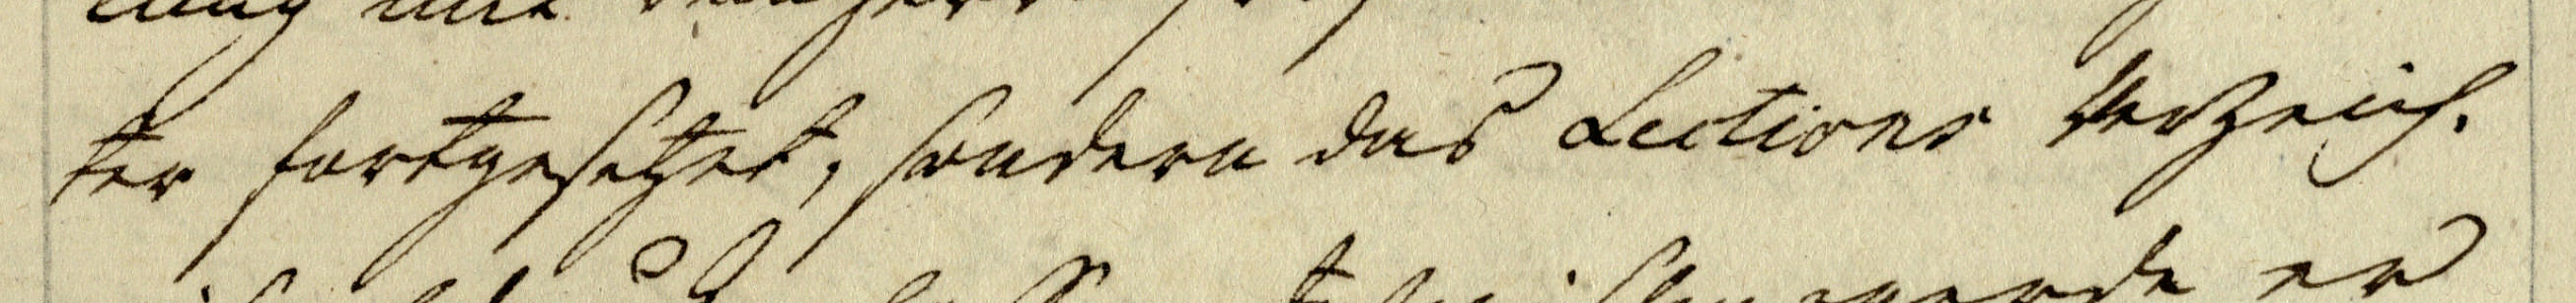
ter fortgesetzt, sondern das Lections Verzeich¬
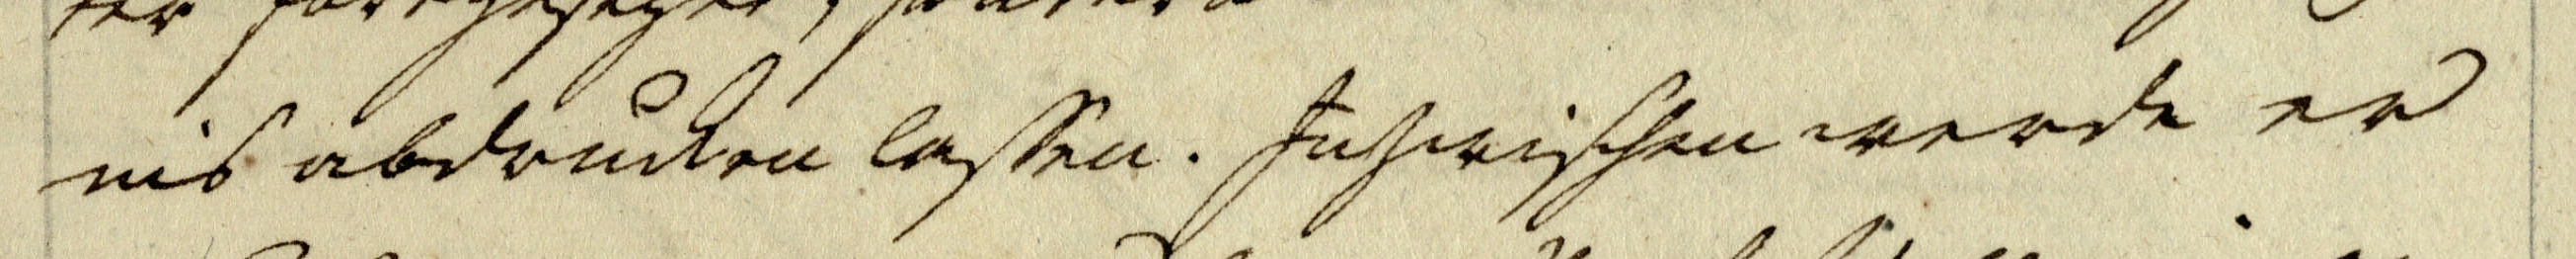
nis abdrucken lassen. Inzwischen werde er
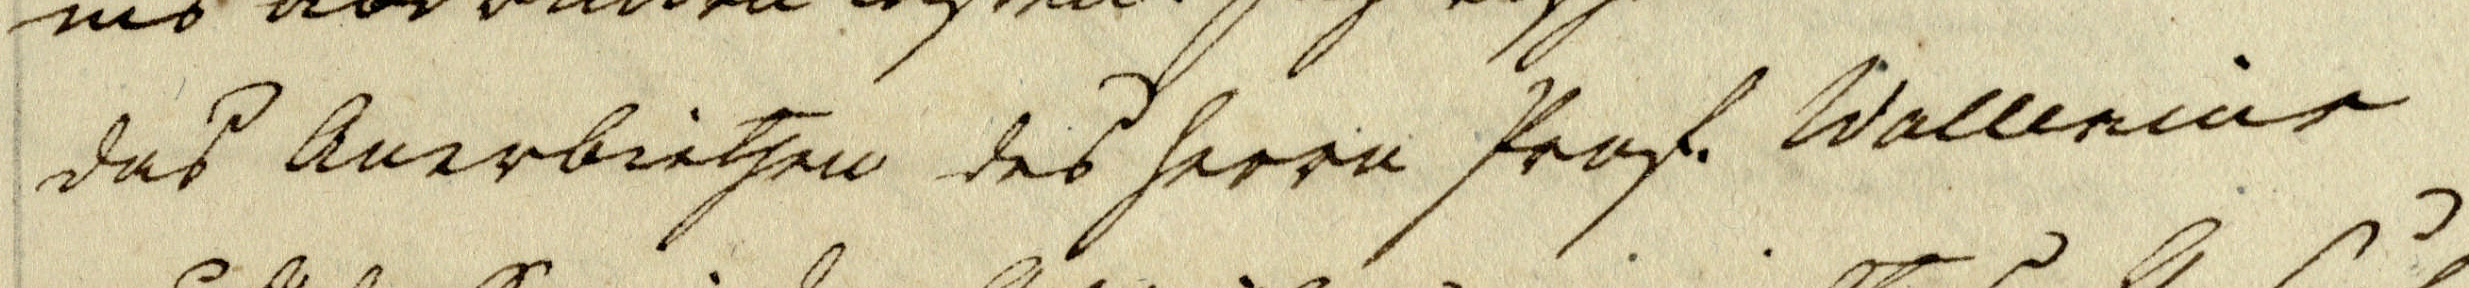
das Anerbiethen des Herrn Prof. Wallenius
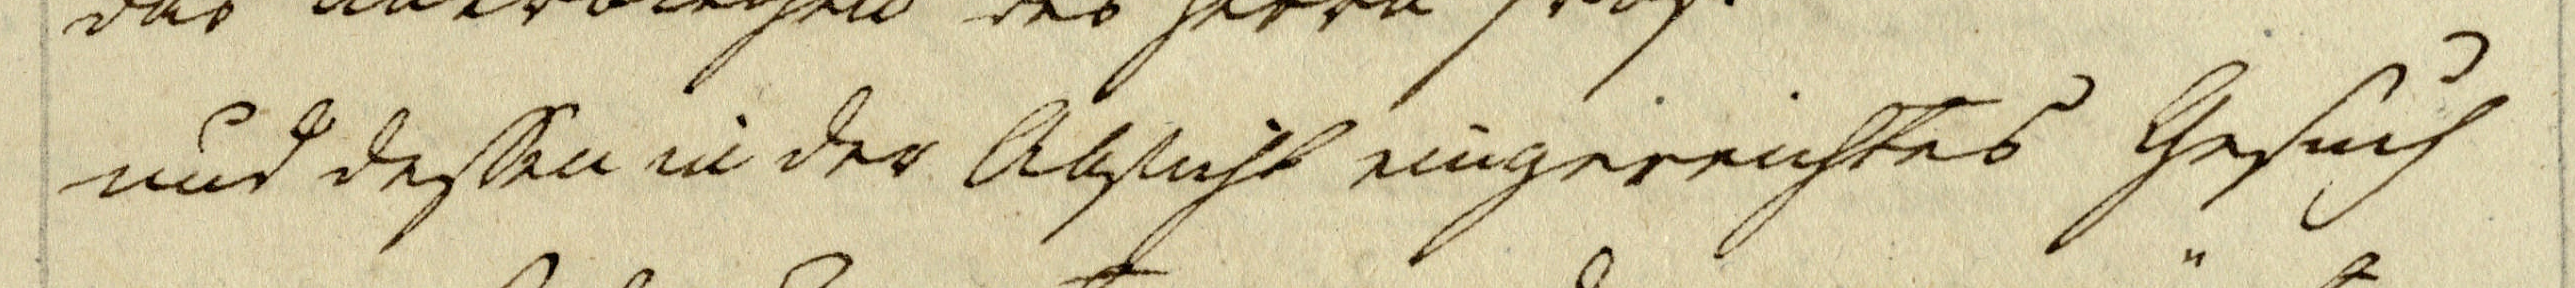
und dessen in der Absicht eingereichtes Gesuch
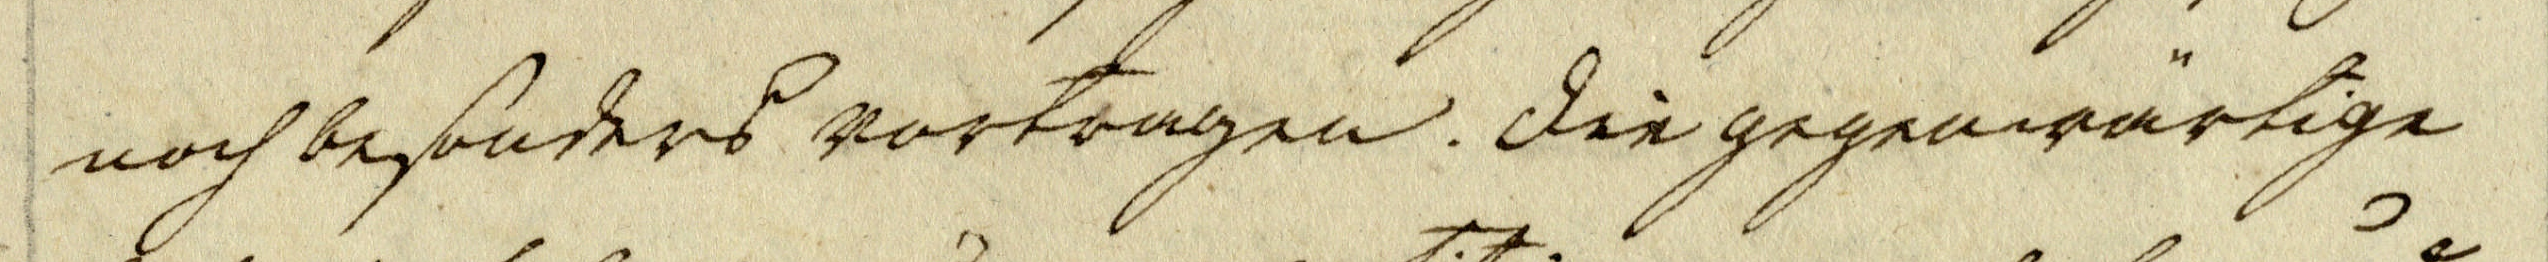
noch besonders vortragen. Die gegenwärtige
